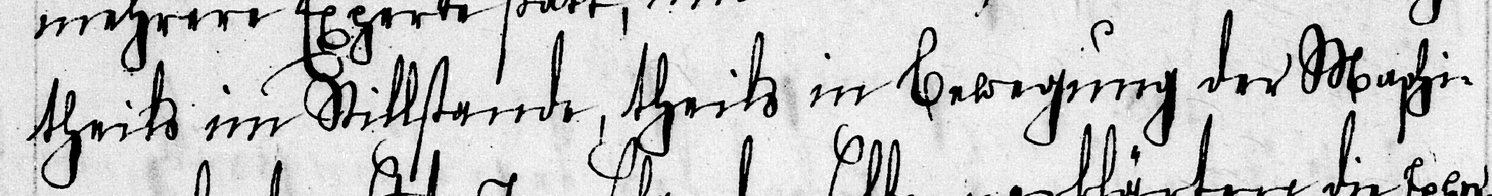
theils im Stillstande, theils in Bewegung der Maschi¬
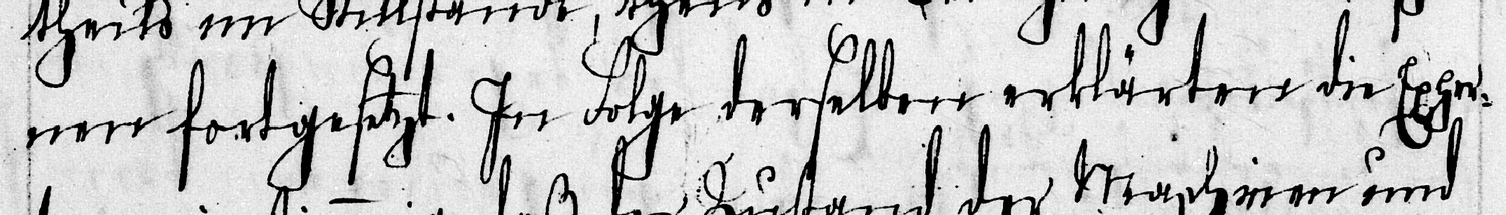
nen fortgesetzt. In Folge derselben erklärten die Expe¬
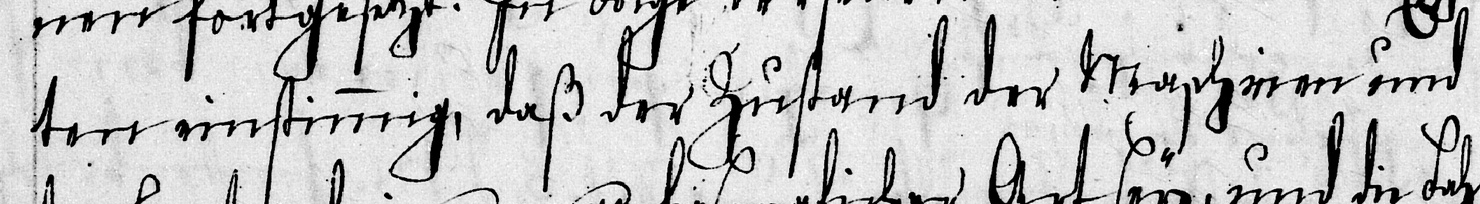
rten einstimmig, daß der Zustand der Maschinen und
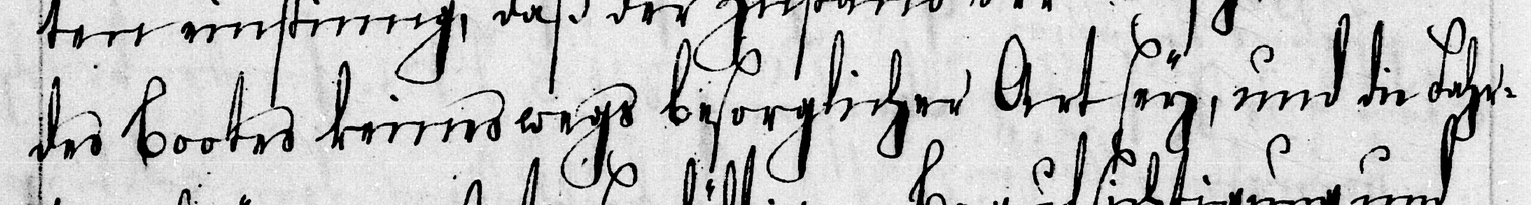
des Bootes keineswegs besorglicher Art sey, und die Fahr¬
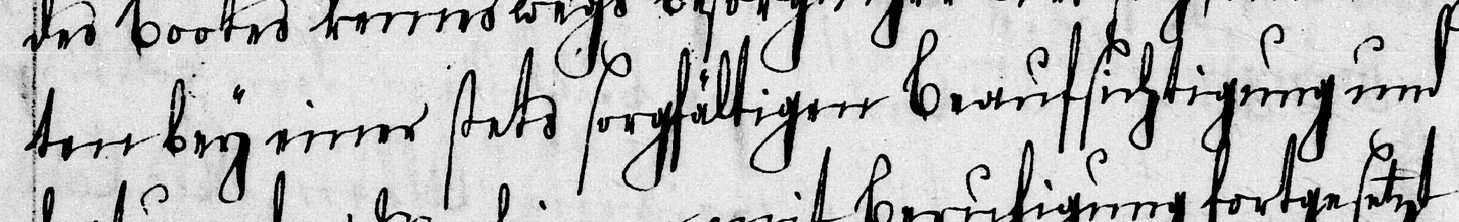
ten bey einer stets sorgfältigen Beaufsichtigung und
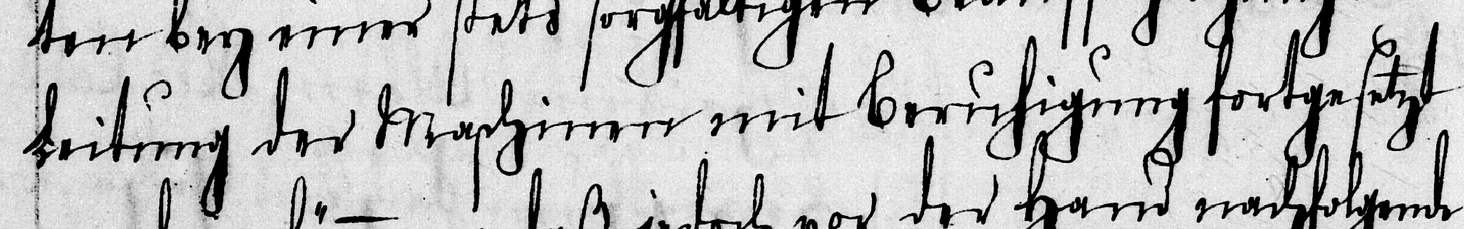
Leitung der Maschinen mit Beruhigung fortgesetzt
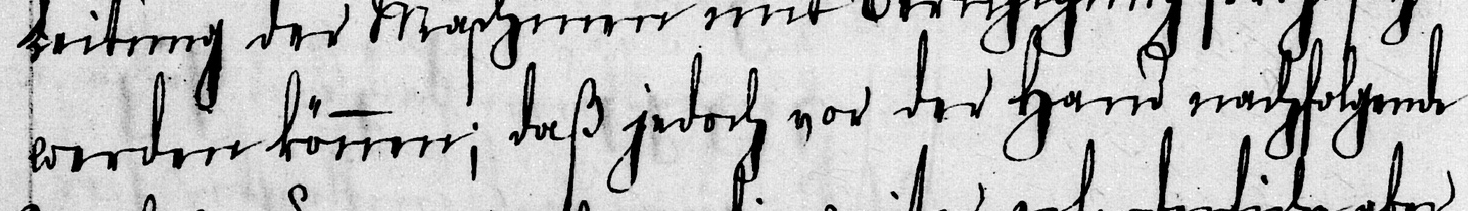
werden können; daß jedoch vor der Hand nachfolgende
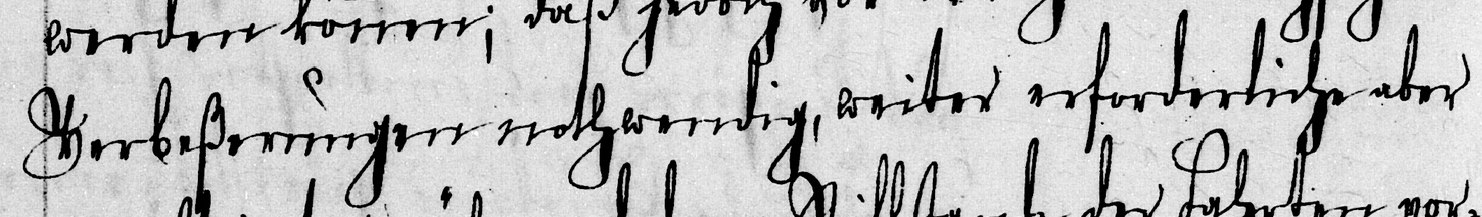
Verbeßerungen nothwendig, weiter erforderliche aber
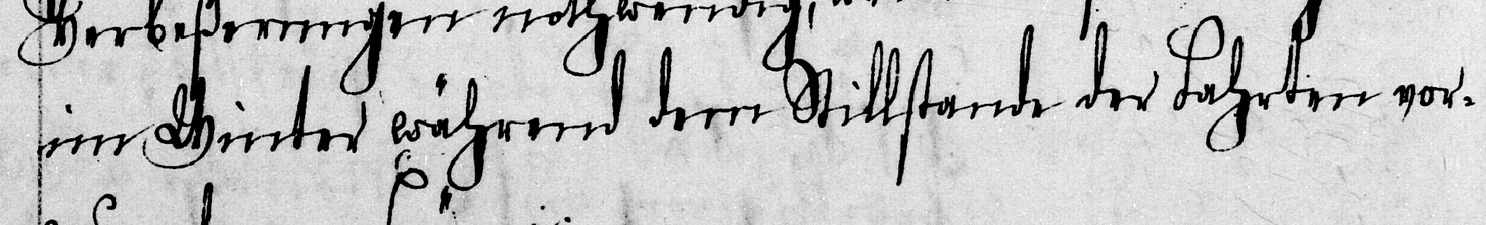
im Winter während dem Stillstande der Fahrten vor¬
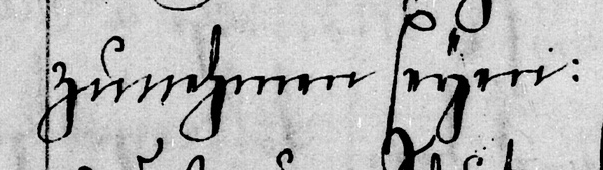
zunehmen seyen:
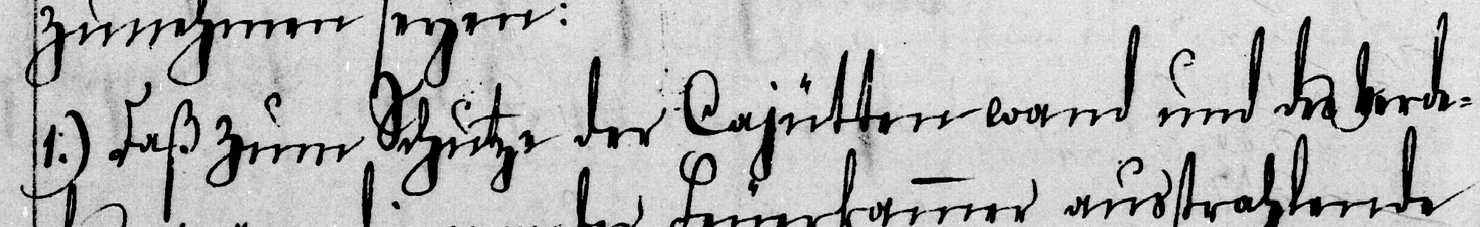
1.) Daß zum Schutze der Cajüttenwand und des Verde¬
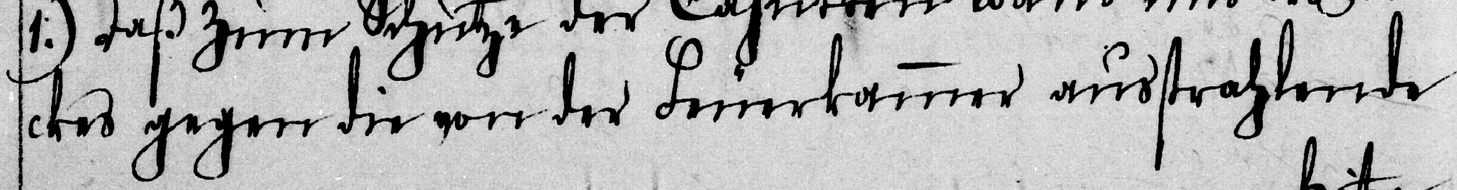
ckes gegen die von der Feuerkammer ausstrahlende
